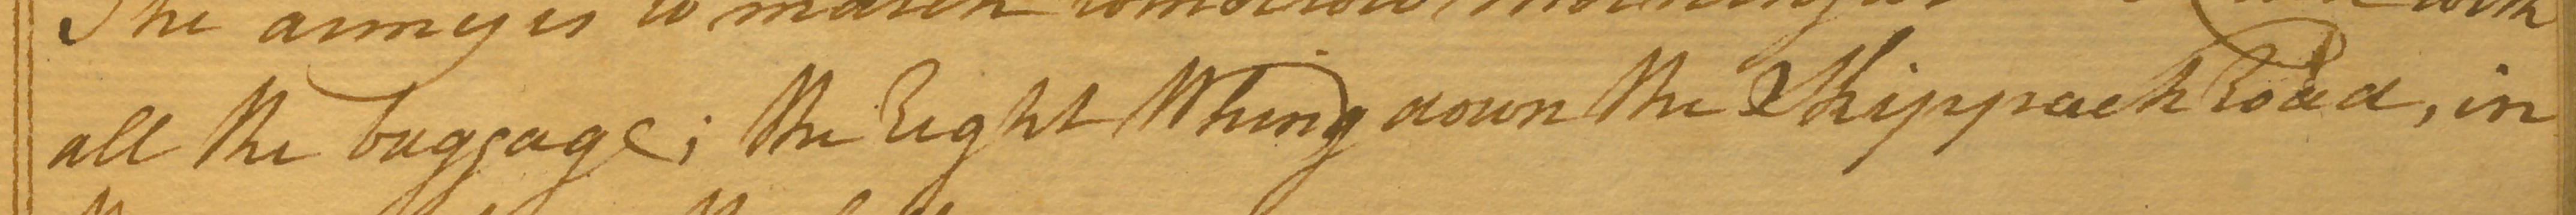all the baggage; the right Whing down the Skippack Road, in
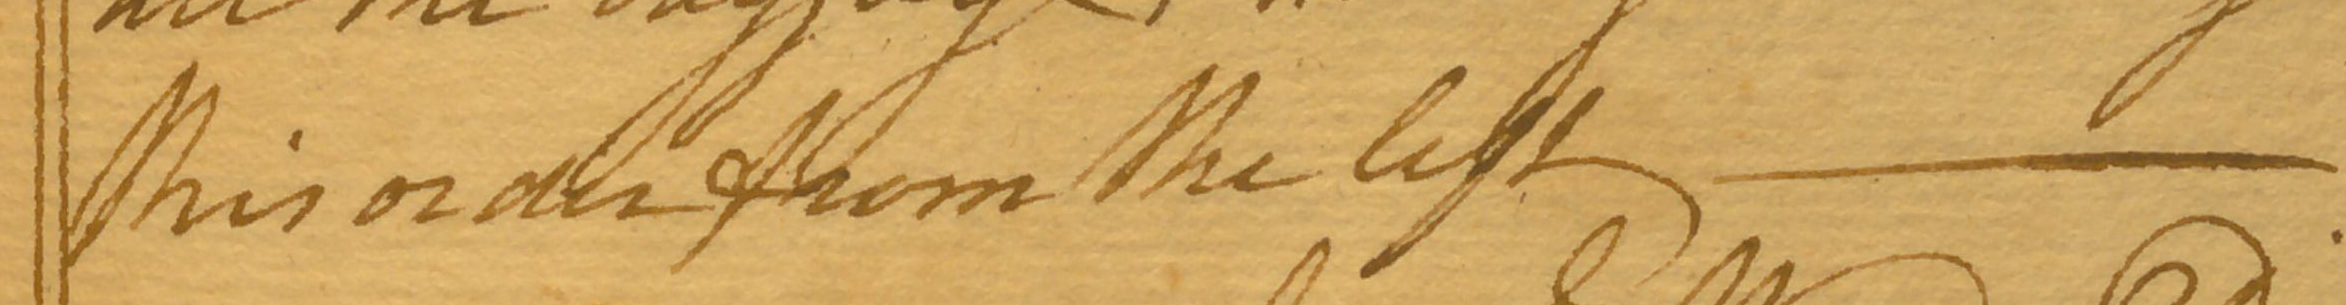this order from the left-
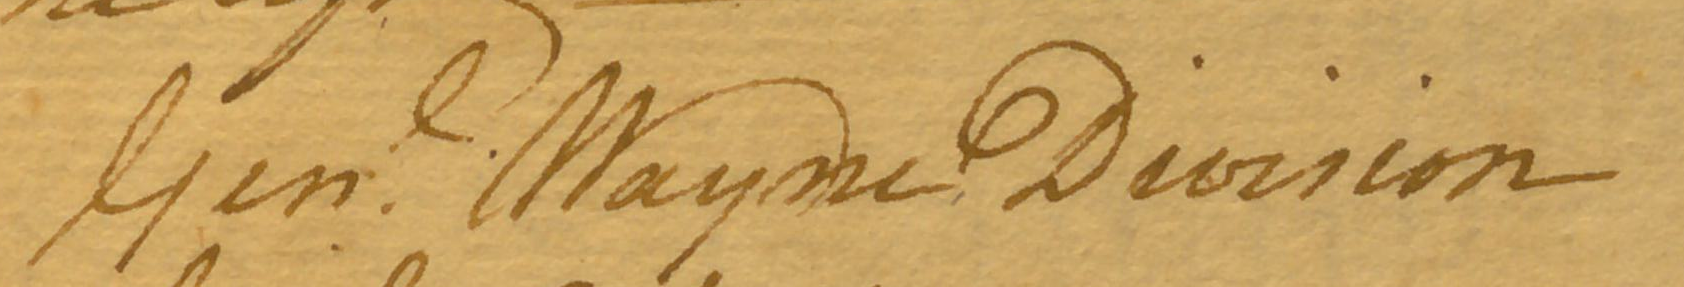Gen^l. Wayne Division
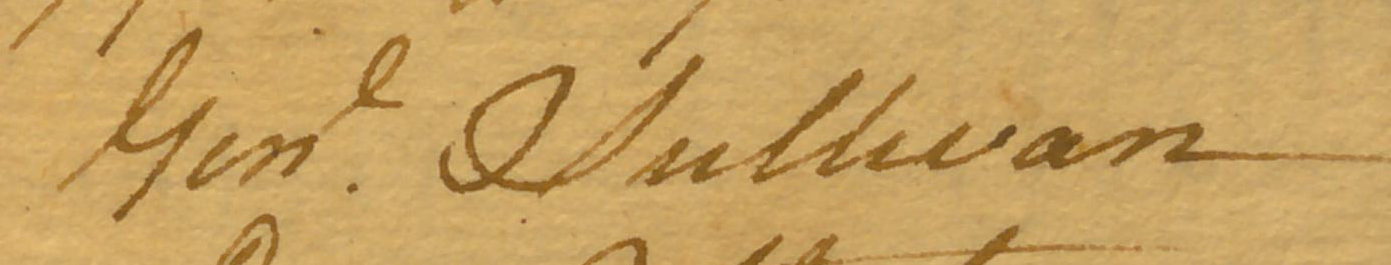Gen^l. Sullivan
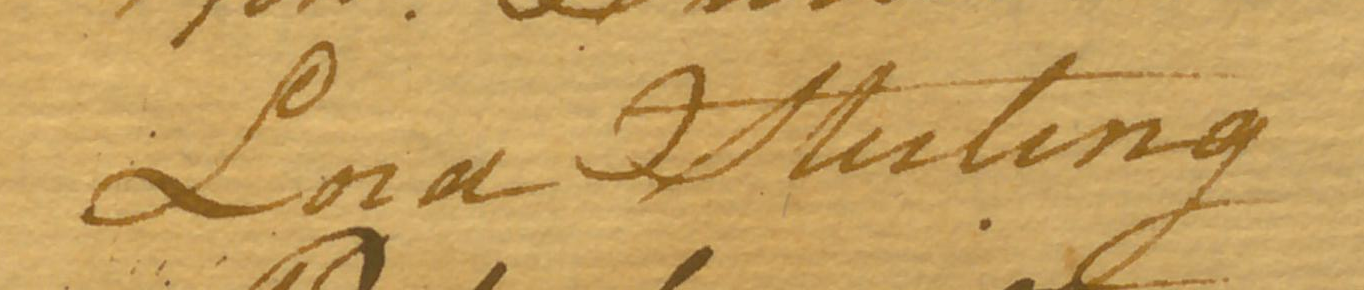Lord Sterling
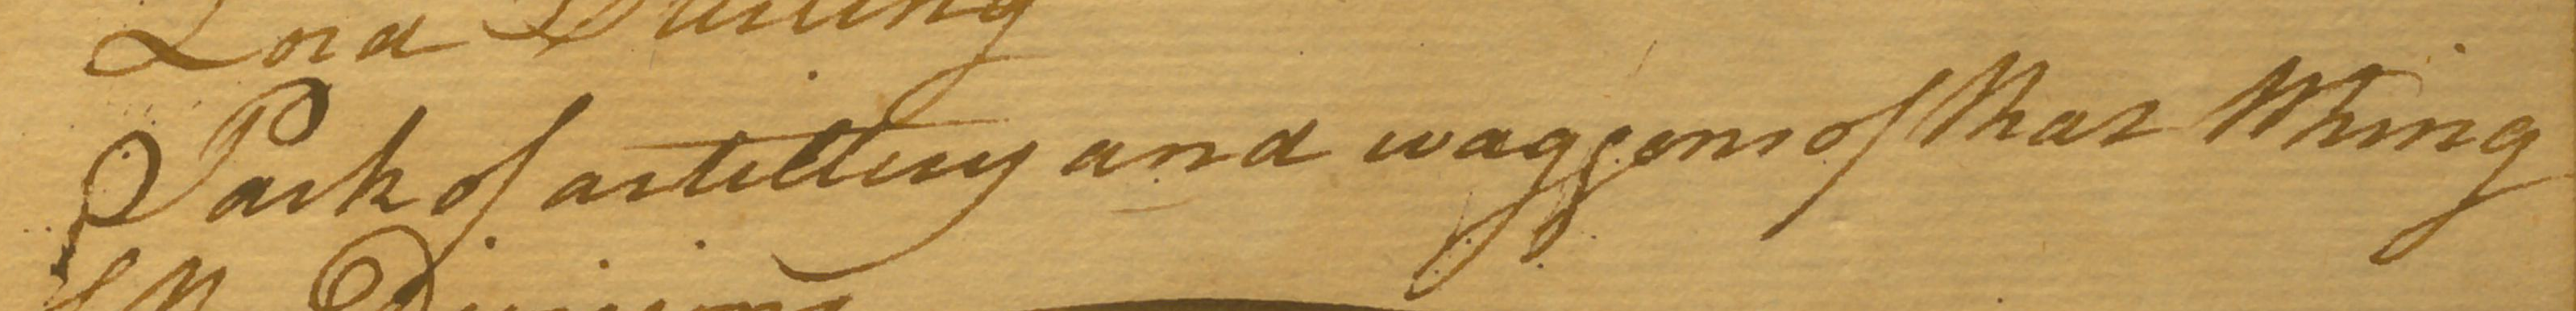Park of artillery and waggons of that Whing
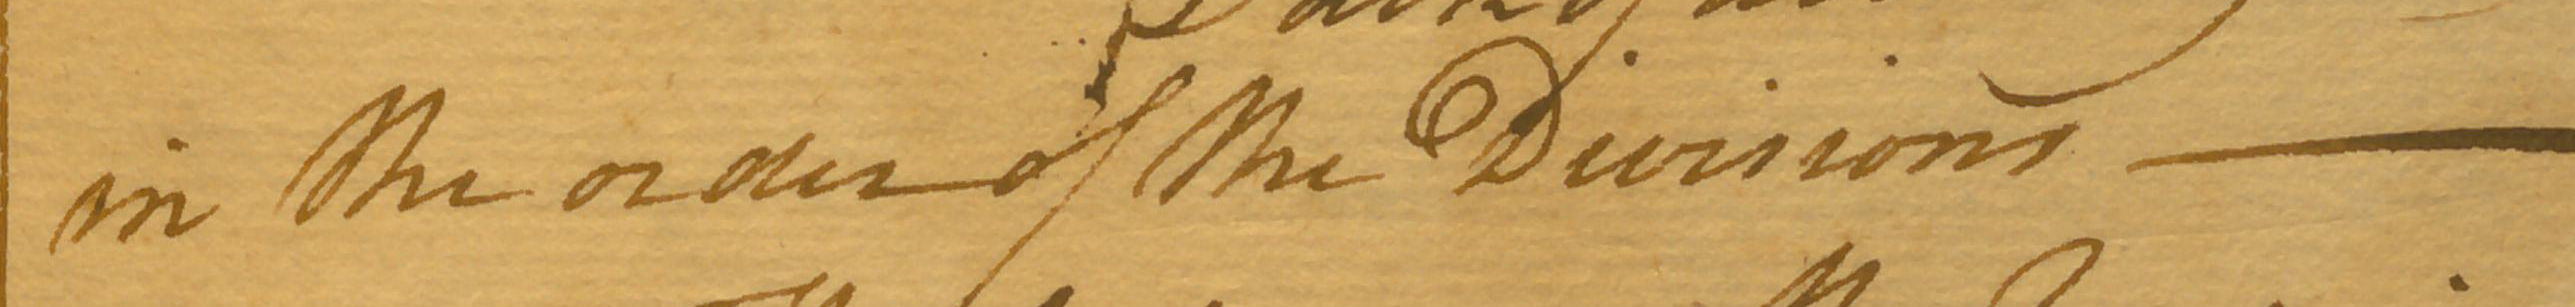in the order of the Divisions-
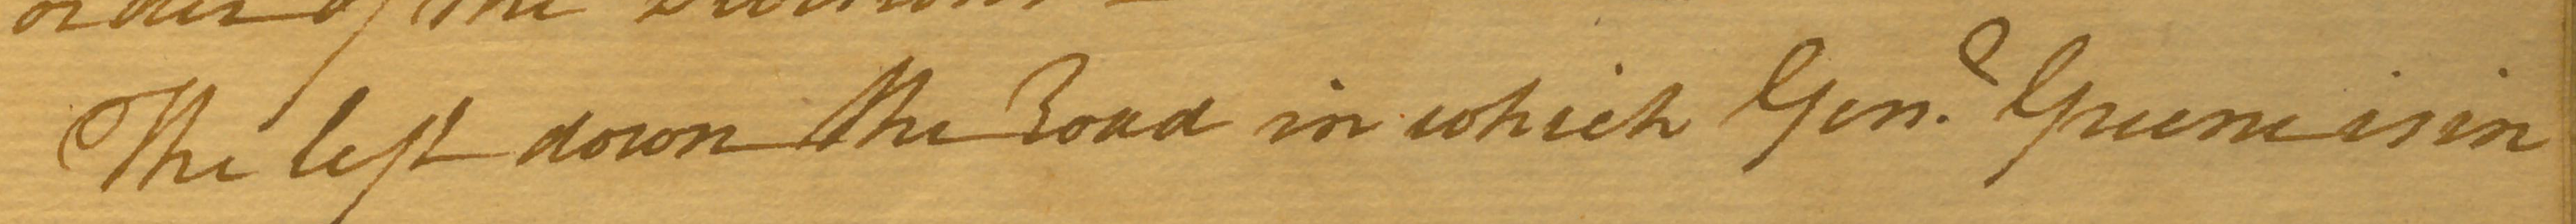The left down the road in which Gen^l. Greene is in
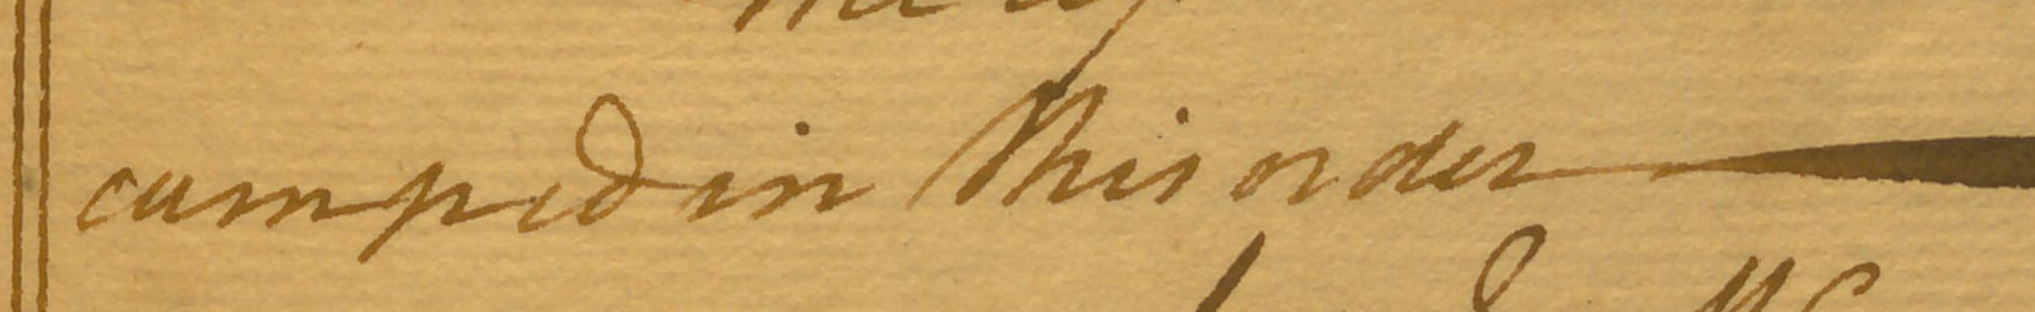camped in this order
